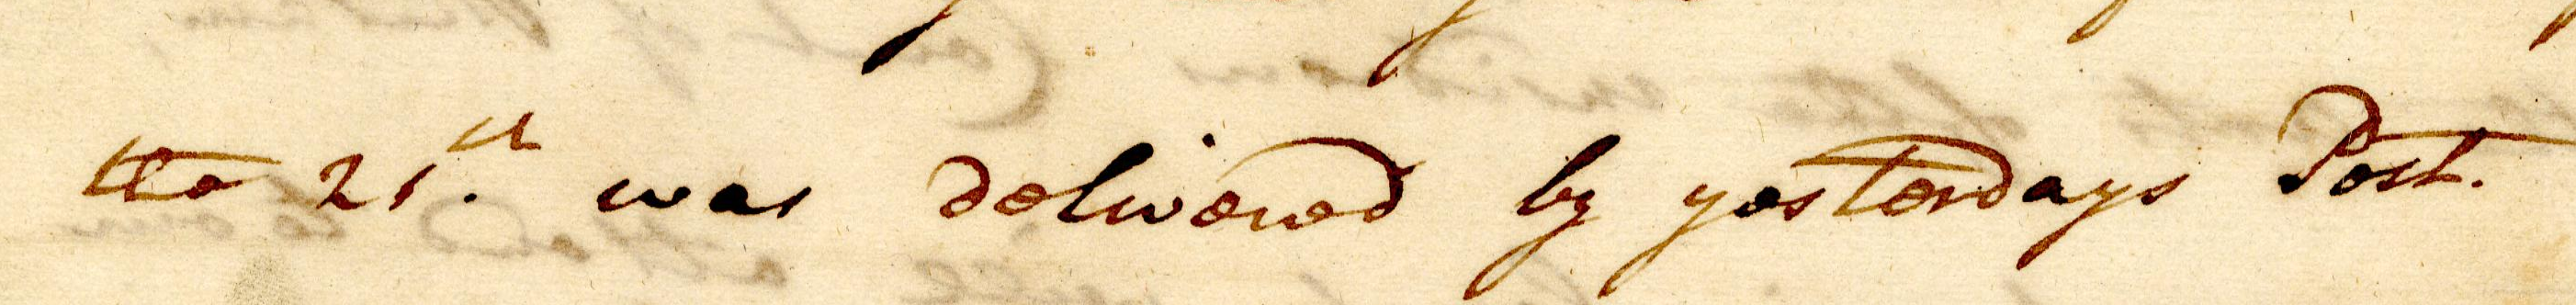the 21^st. was deliverd by yesterdays Post.
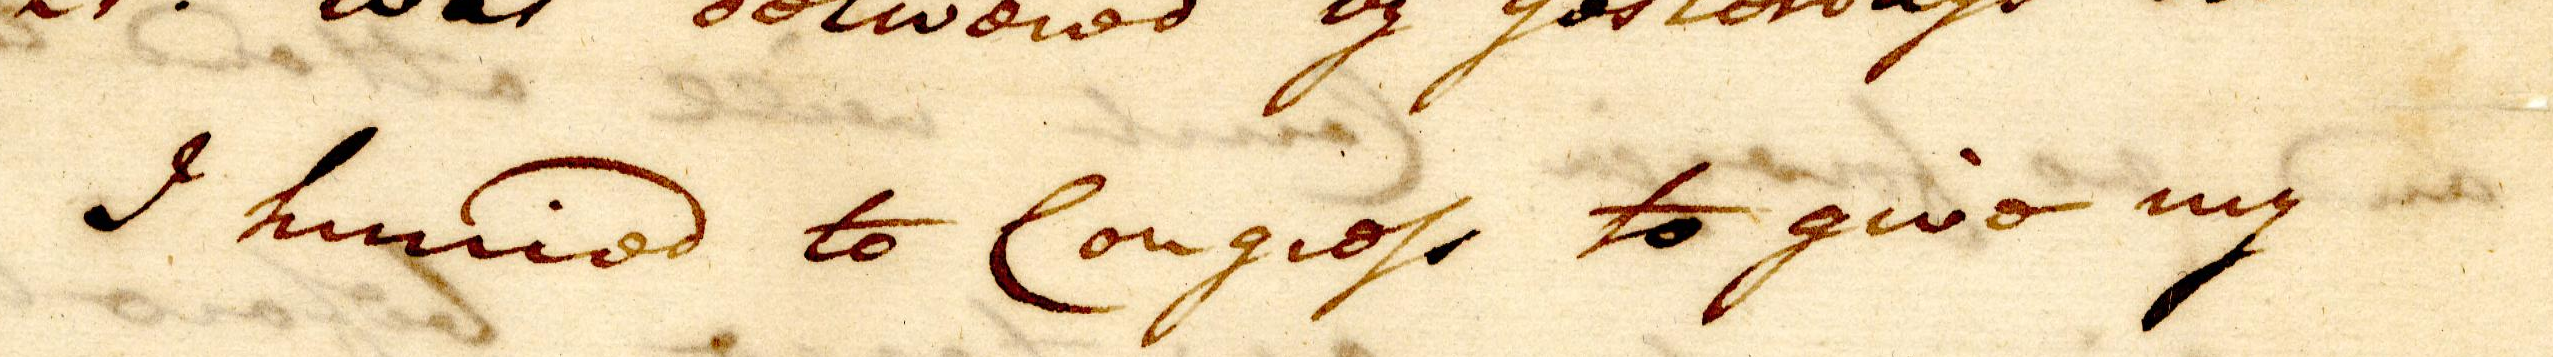I hurried to Congress to give my
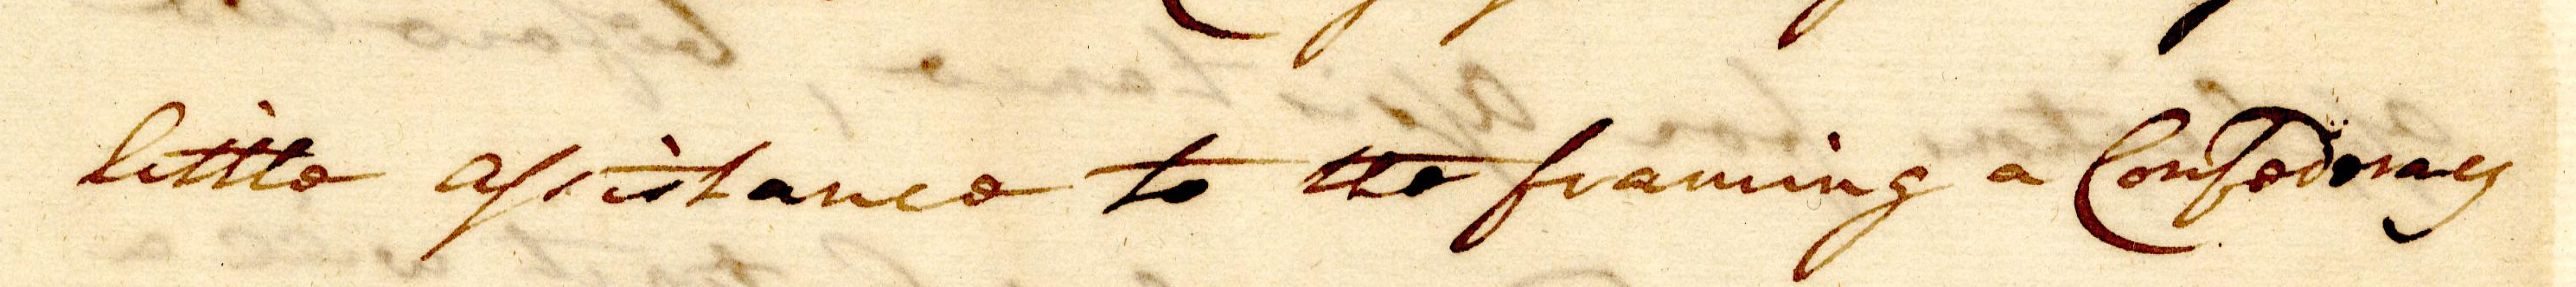little assistance to the framing a Confederacy
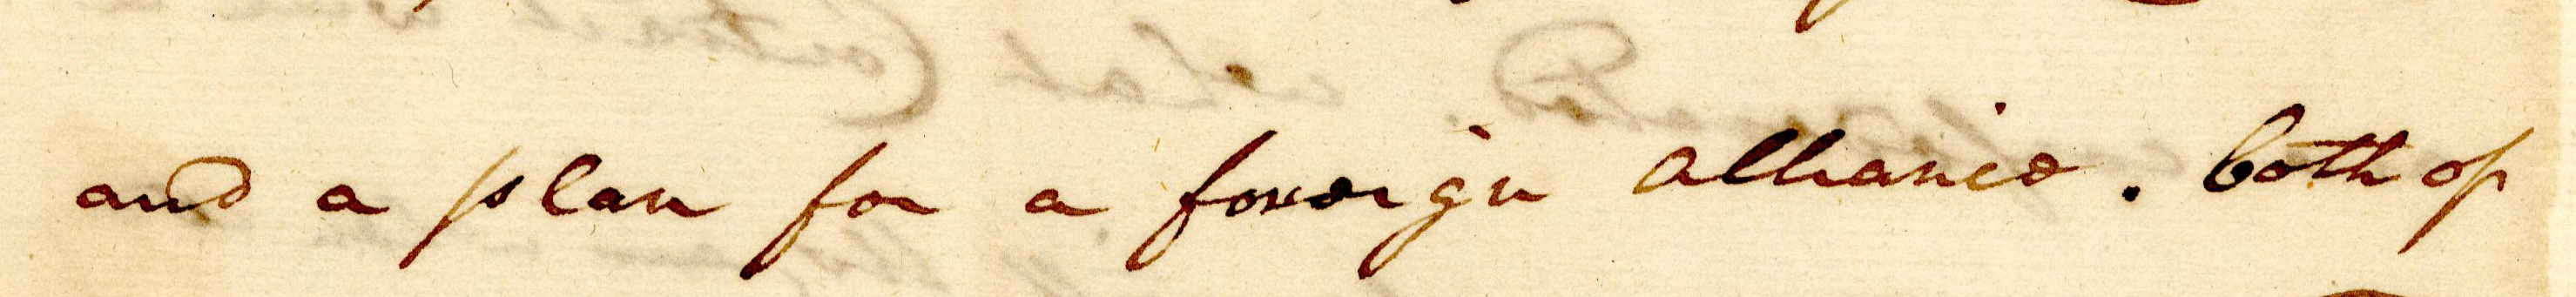and a plan for a foreign alliance. Both of
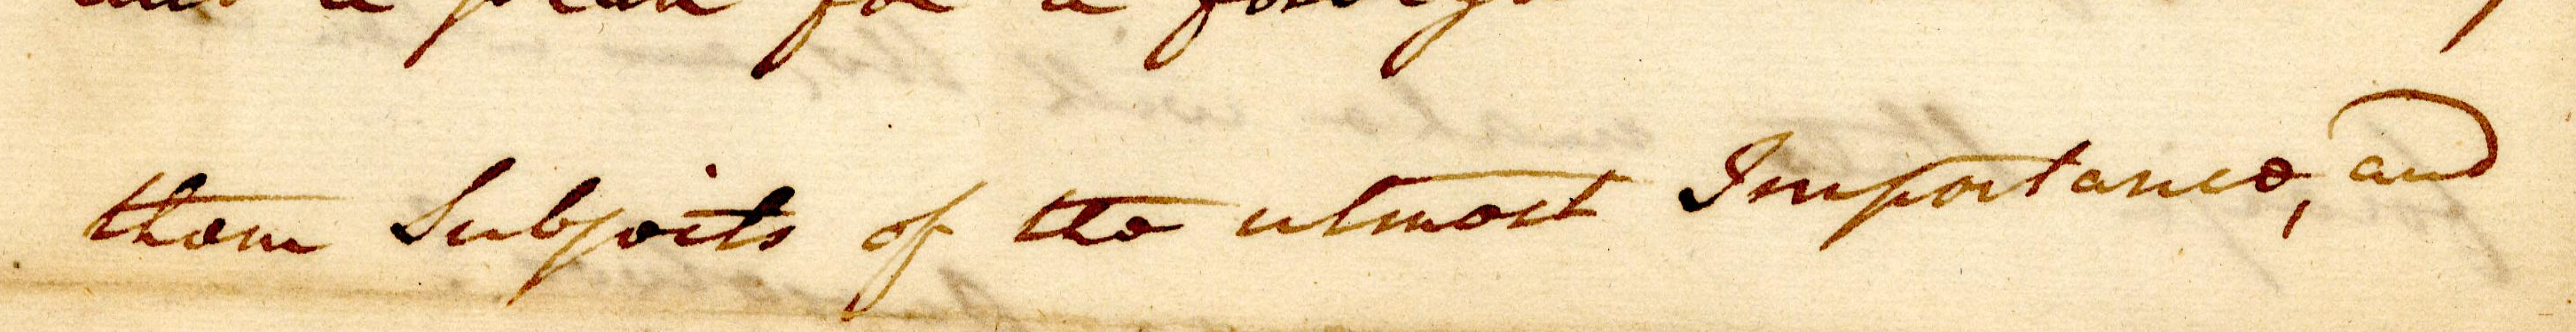these Subjects of the utmost Importance, and
